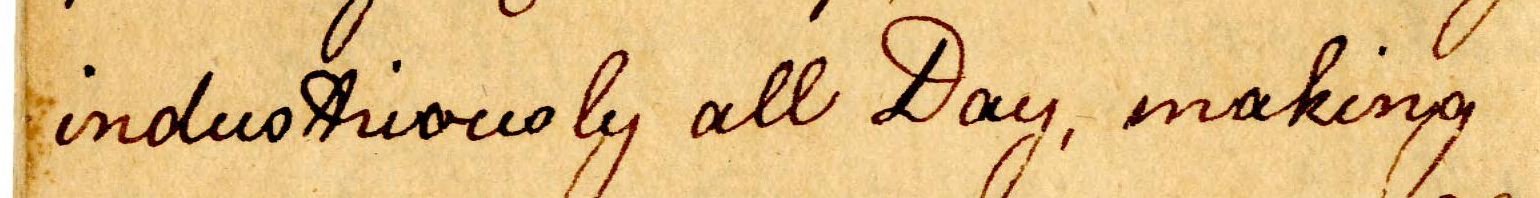industriously all Day, making
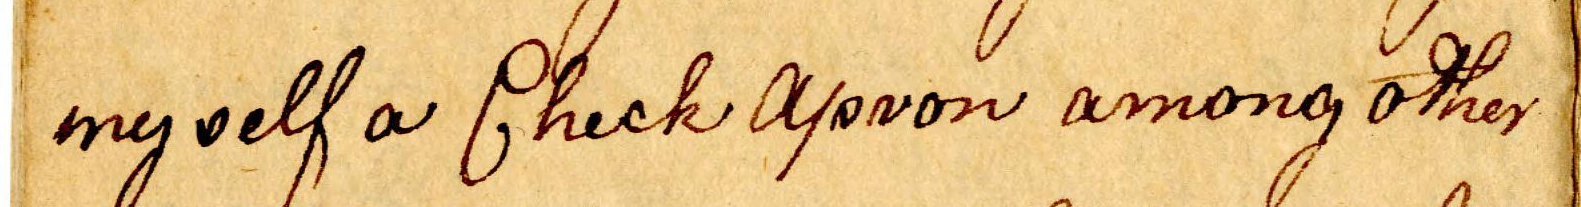myself a Check Apron among other
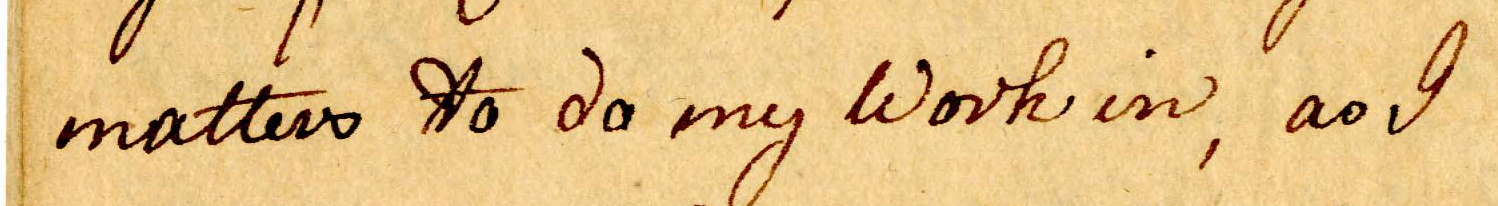matters to do my Work in, as I
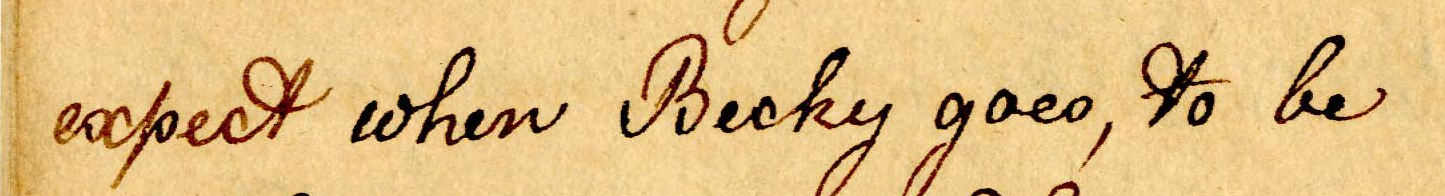expect when Becky goes, to be
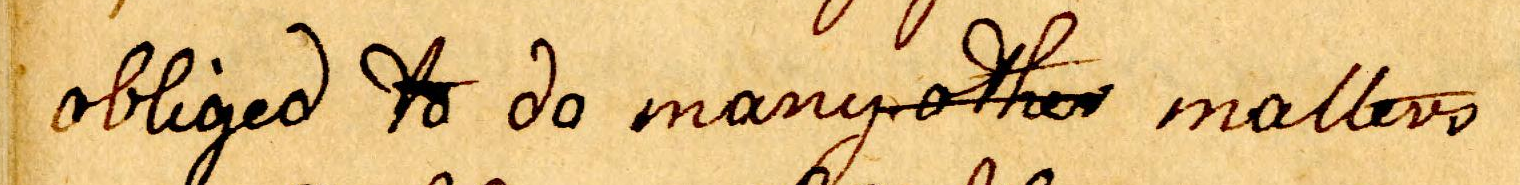obliged to do many other matters
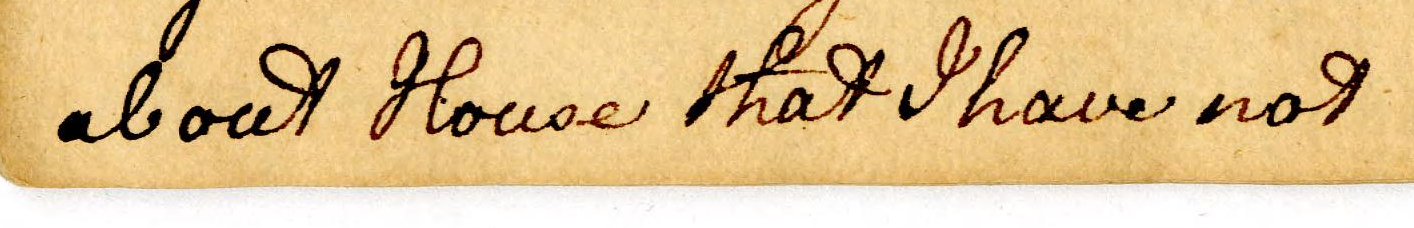about House that I have not
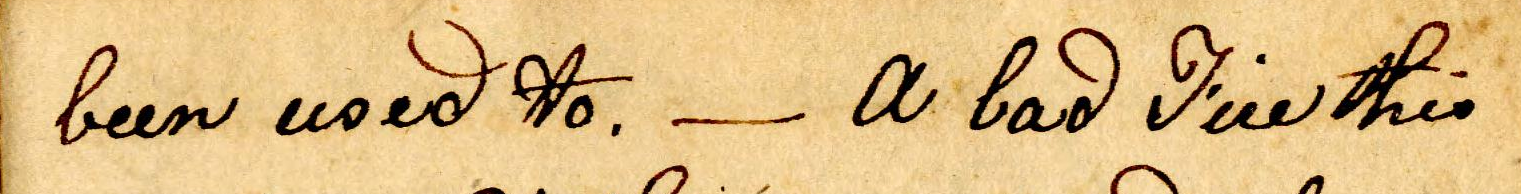been used to.- A bad Fire this
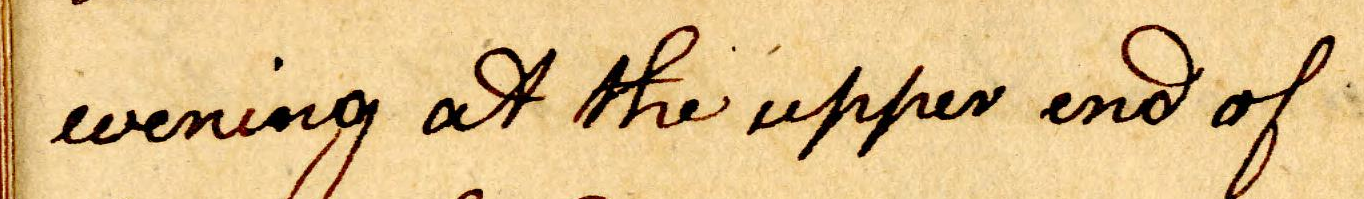evening at the upper end of
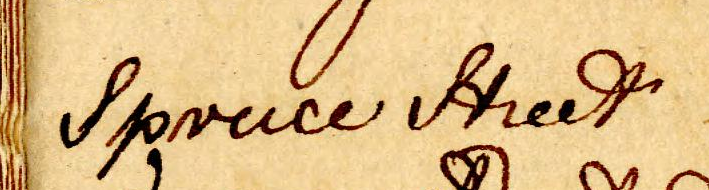Spruce Street
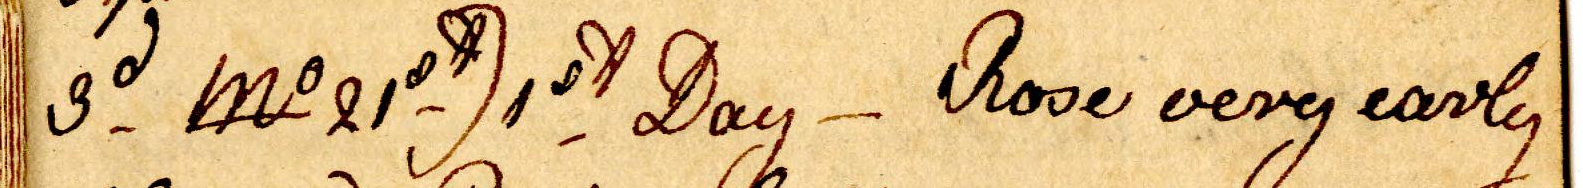3^d M^o 21^st) 1^st Day- Rose very early
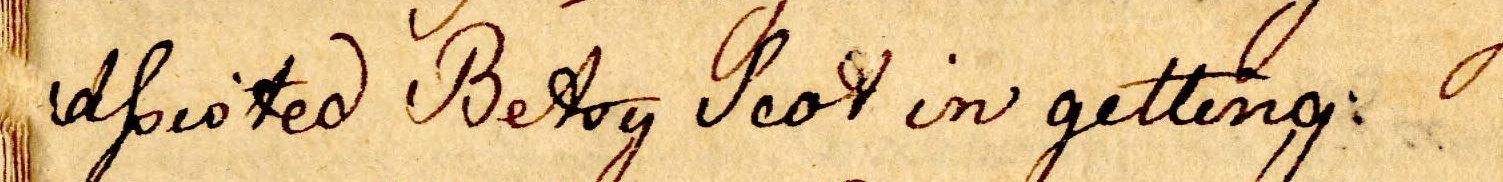assisted Betsy Scot in getting.
